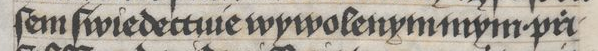ſem ſwiedectuie wyolenym mym.pṙi¬
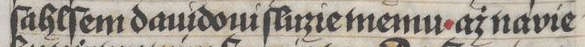ſahlſem dauidoui ſluzie memu.aż navie¬
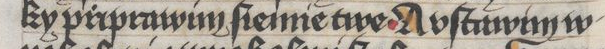ky pṙiprawím ſiemie twe.A vſtawim w¬
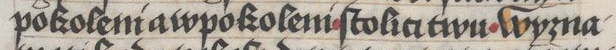pokolení a wpokoleni.ſtolici twu.Wyzna¬
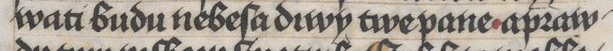wati budu nebeſa diwy twe pane.a praw¬
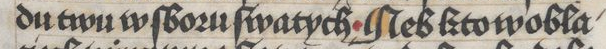du twu w ſboru ſwatych.Neb kto to wobla¬
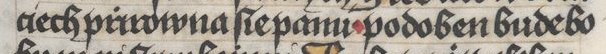ciech pṙirowna ſie panu.podoben bude bo¬
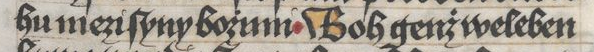hu mezi ſyny bożimi.Boh genż weleben
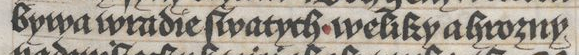bywa wradie ſwatych.weliky a hrozny
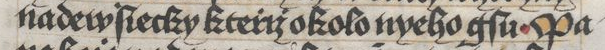nadewẛiecky kteṙiż okolo nyeho gſu.Pa¬
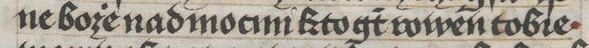ne boże nad mocmi kto ḡt rowen tobie.
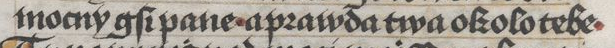mocný gſi pane.a prawda twa okolo tebe.
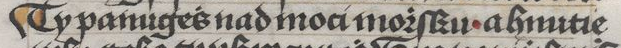Ty panugeṡ nad moci moṙſku.a hnutie
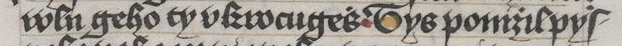wlu geho ty vkrocugeṡ.Tys pomżil pyẛ¬
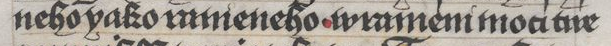neho yako ranieneho.wrameni moci twe
